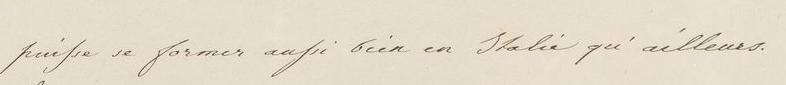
puisse se former aussi bien en Italie qu'ailleurs.
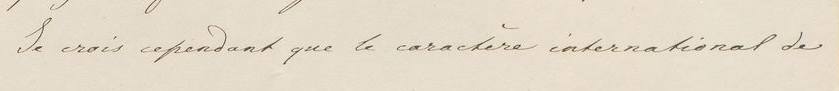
Je crois cependant que le caractère international de
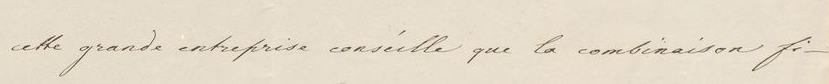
cette grande entreprise conseille que la combinaison fi-
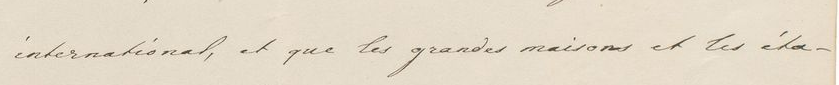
international, et que les grandes maisons et les éta-
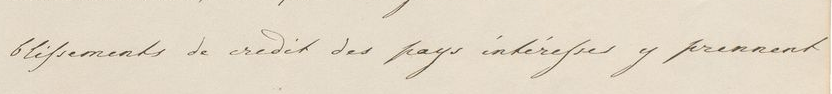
blissements de credit des pays intéresses y prennent
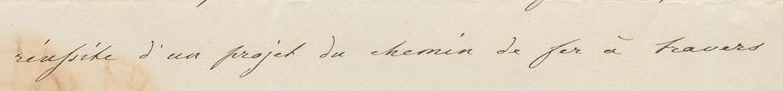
réussite d'un projet du chemin de fer à travers
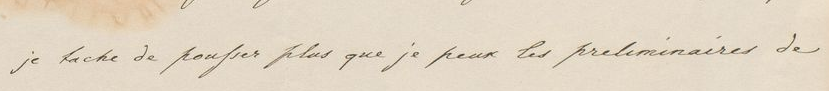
je tache de pousser plus que je peux les preliminaires de
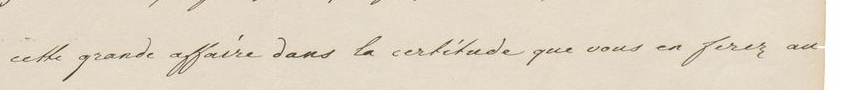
cette grande affaire dans la certitude que vous en ferez au-
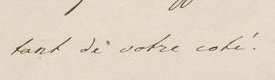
tant de votre coté.
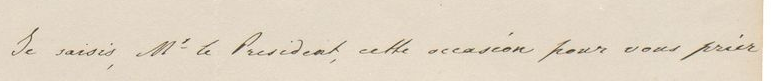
Je saisis, Mr le President, cette occasion pour vous prier
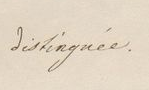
distinguée.
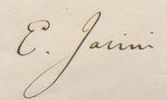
E. Jacini
